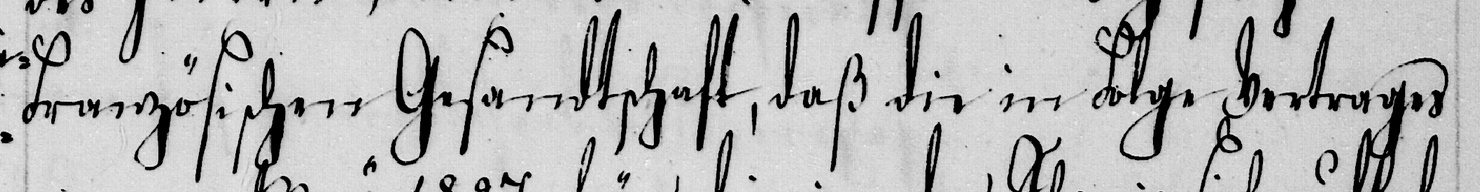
Französischen Gesandtschaft, daß die in Folge Vertrages
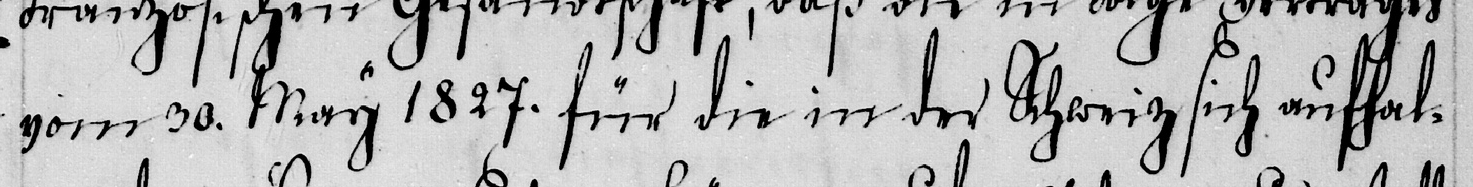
vom 30. May 1827. für die in der Schweiz sich aufhal¬
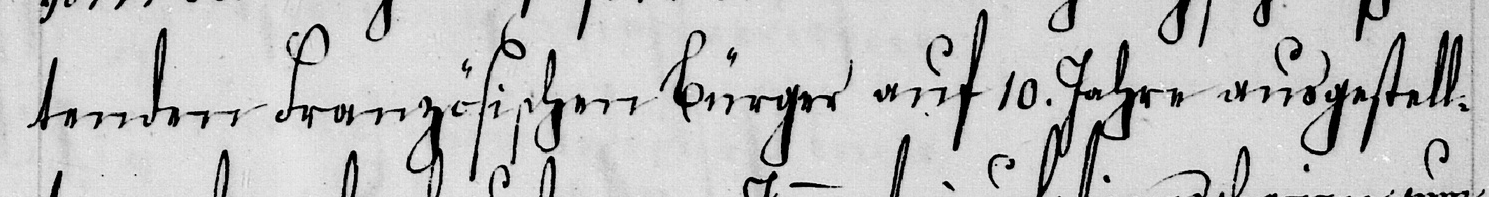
tenden Französischen Bürger auf 10. Jahre ausgestell¬
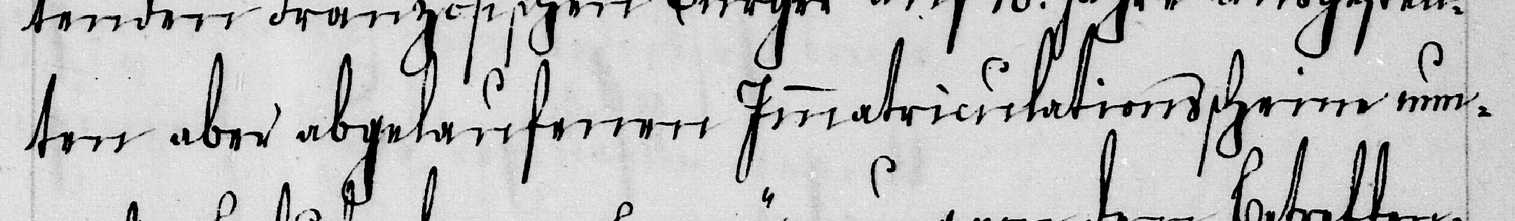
ten aber abgelaufenen Immatriculationsscheine nun¬
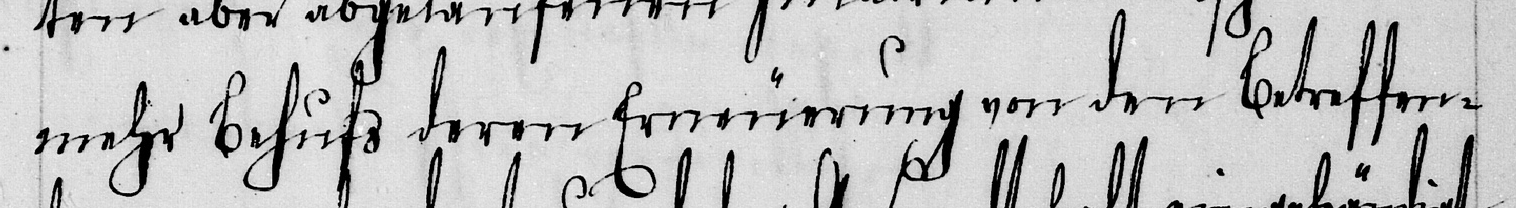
mehr Behufs deren Erneuerung von den Betreffen¬
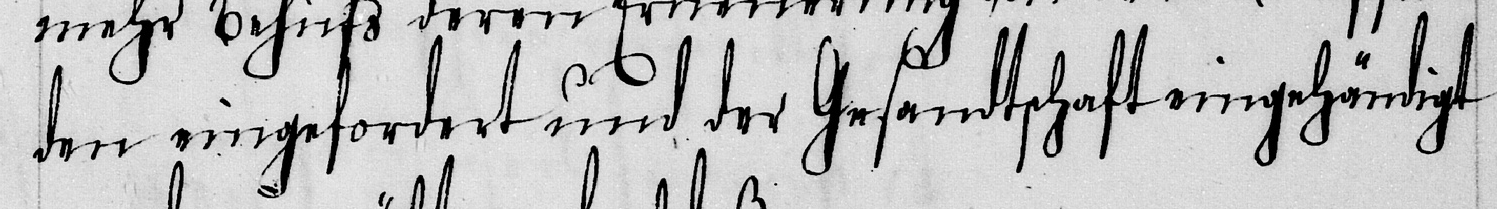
den eingefordert und der Gesandtschaft eingehändigt
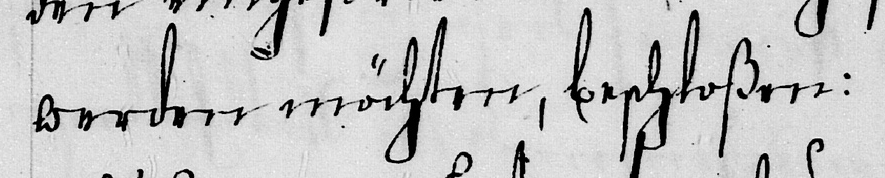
werden möchten, beschloßen:
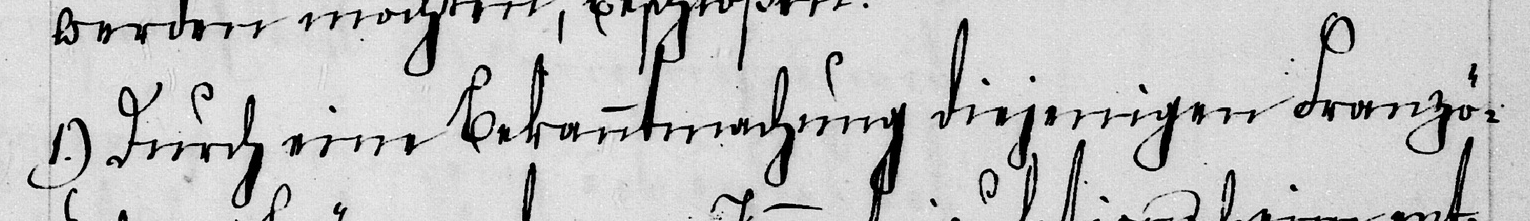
1.) Durch eine Bekanntmachung diejenigen Franzö¬
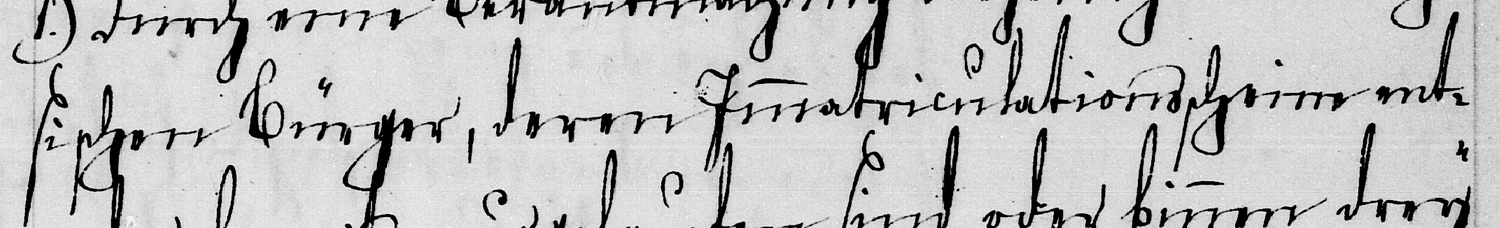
sischen Bürger, deren Immatriculationsscheine ent¬
